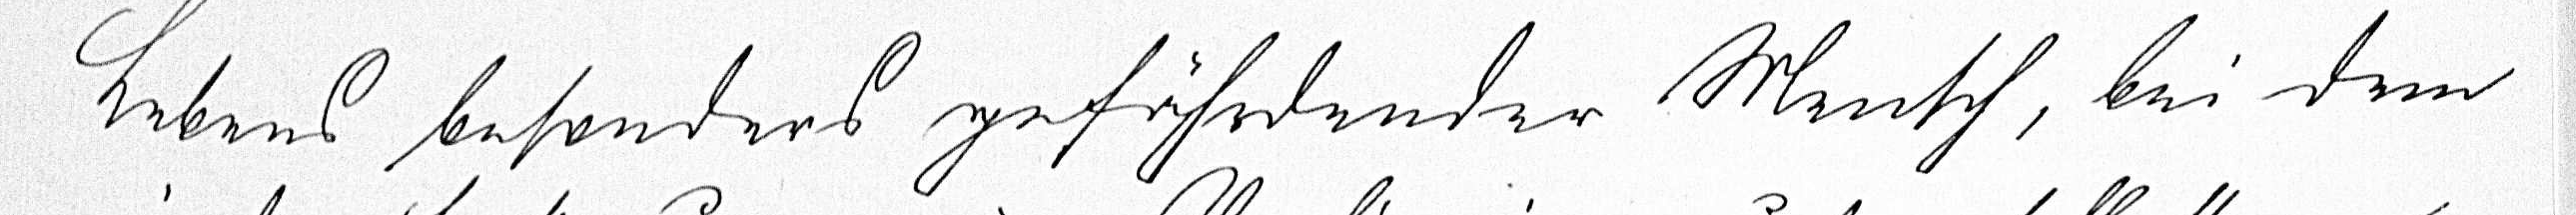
Lebens besonders gefährdender Mensch, bei dem
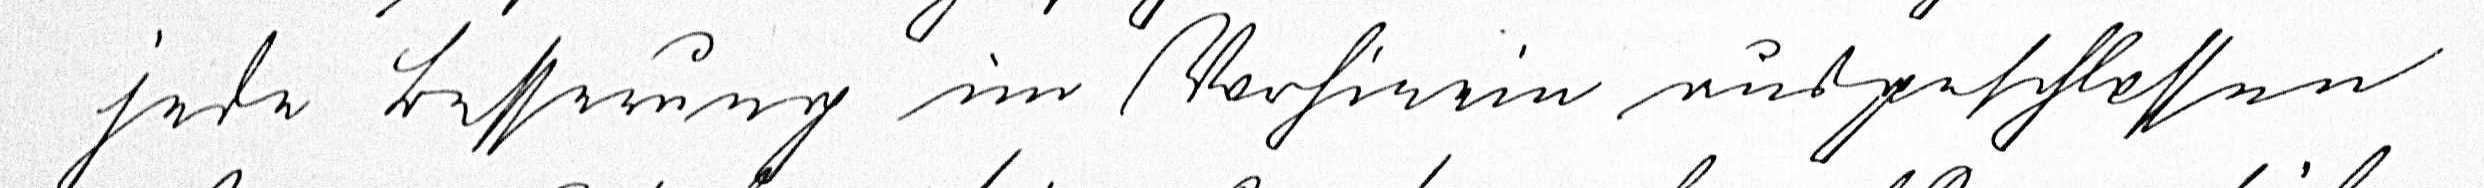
jede Besserung im Vorhinein augeschlossen
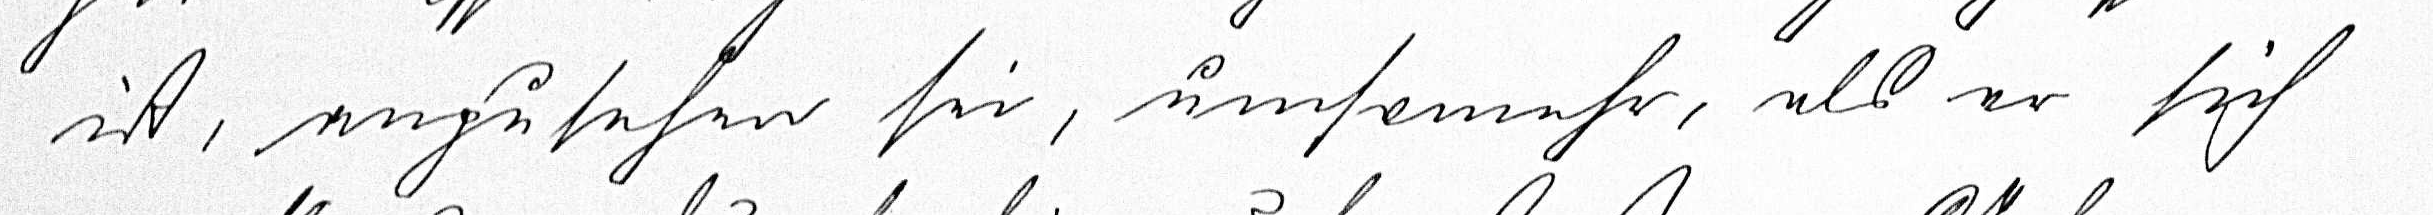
ist, angesehen sei, umsomehr, als er sich
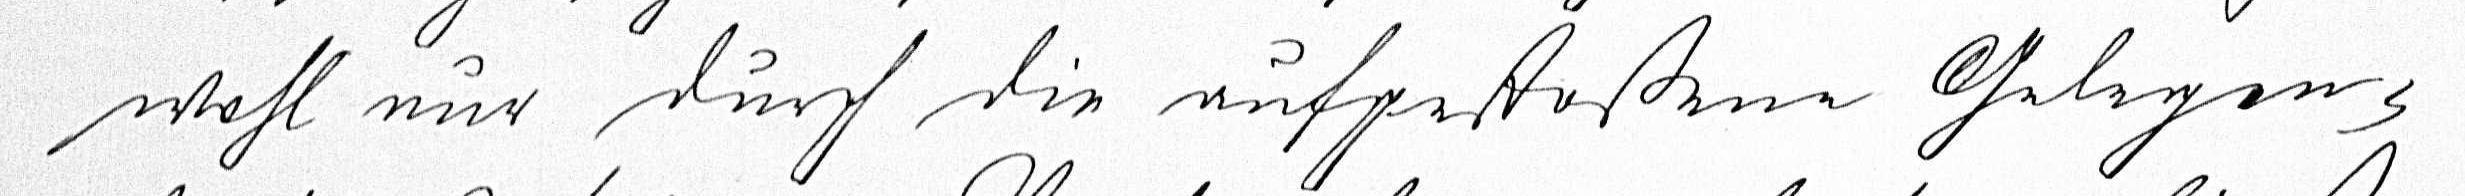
wohl nur durch die aufgestoßene Gelegen¬
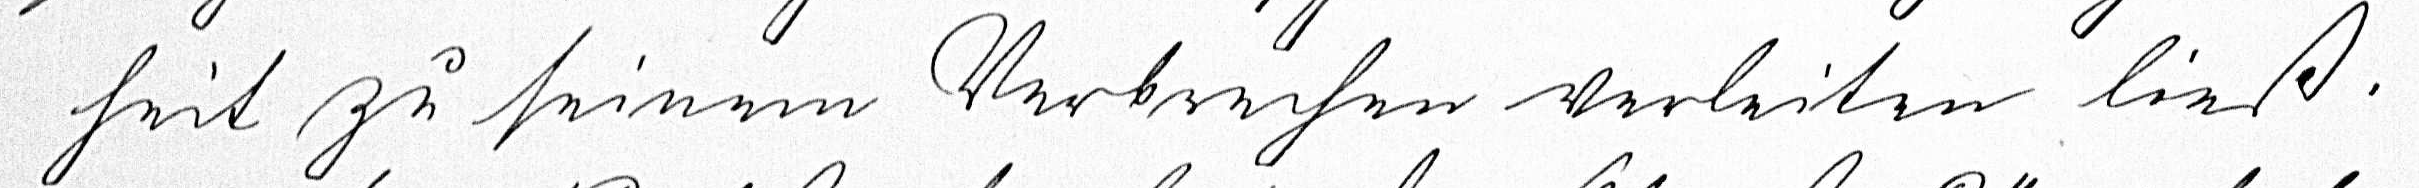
heit zu seinem Verbrechen verleiten ließ.
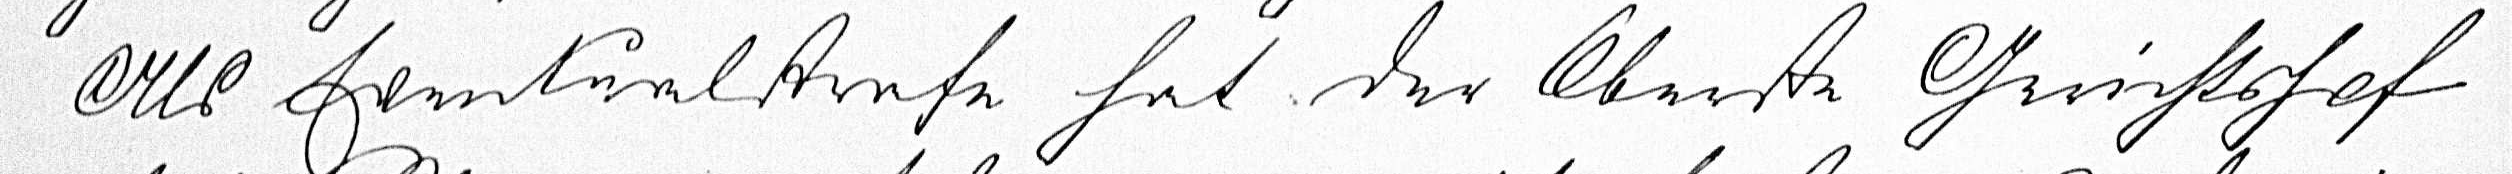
Als Eventuelstrafe hat der Oberste Gerichtshof
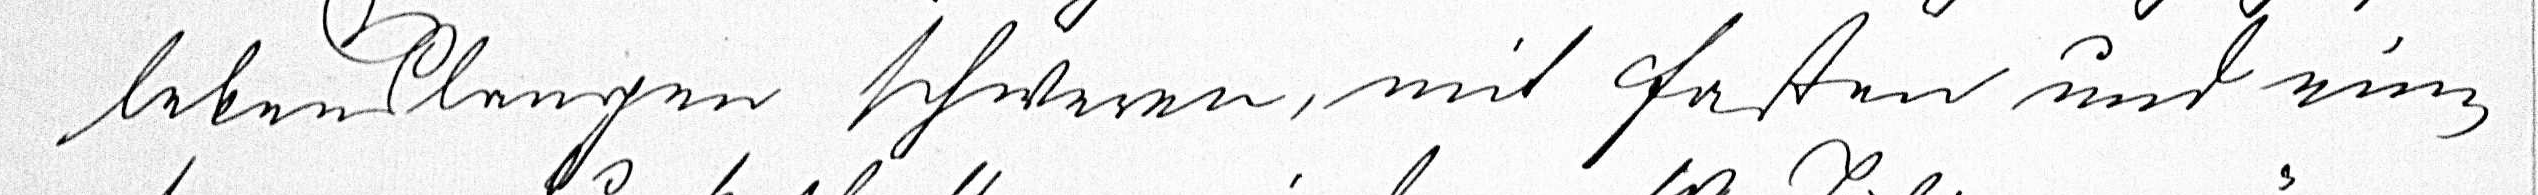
lebenslangen schweren, mit Fasten und ein¬
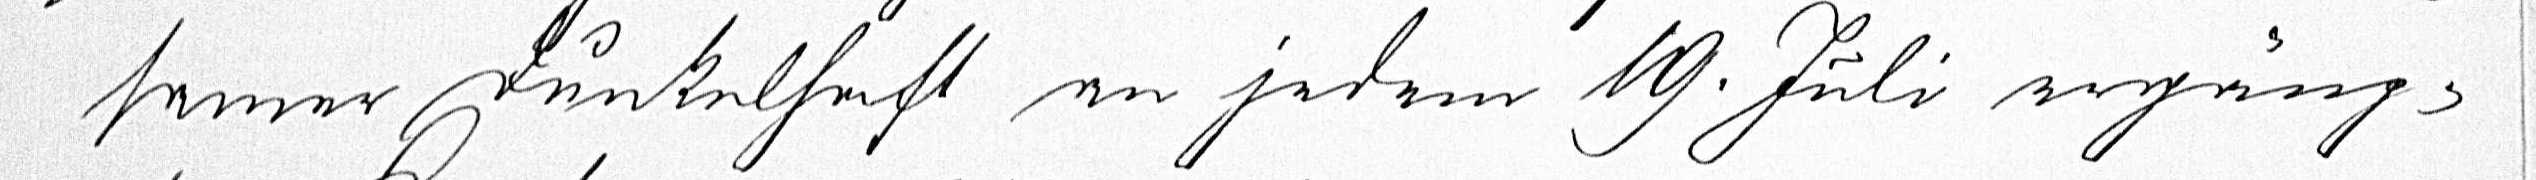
samer Dunkelhaft an jedem 19. Juli ergänz¬
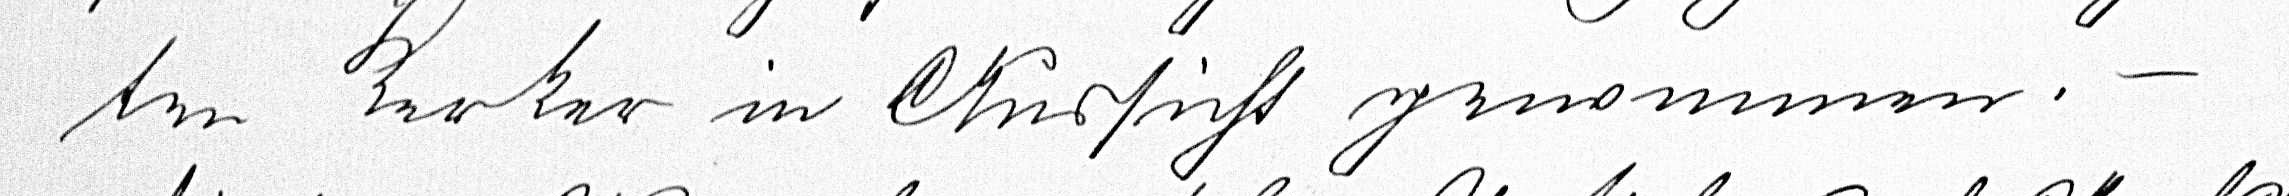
ten Kerker in Aussicht genommen.
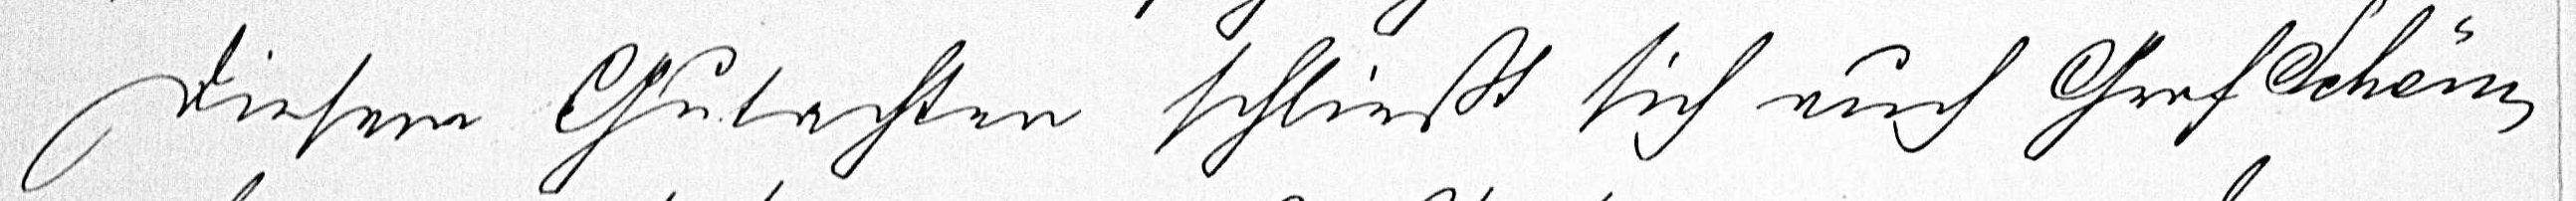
Diesem Gutachten schließt sich auch Graf Schön¬
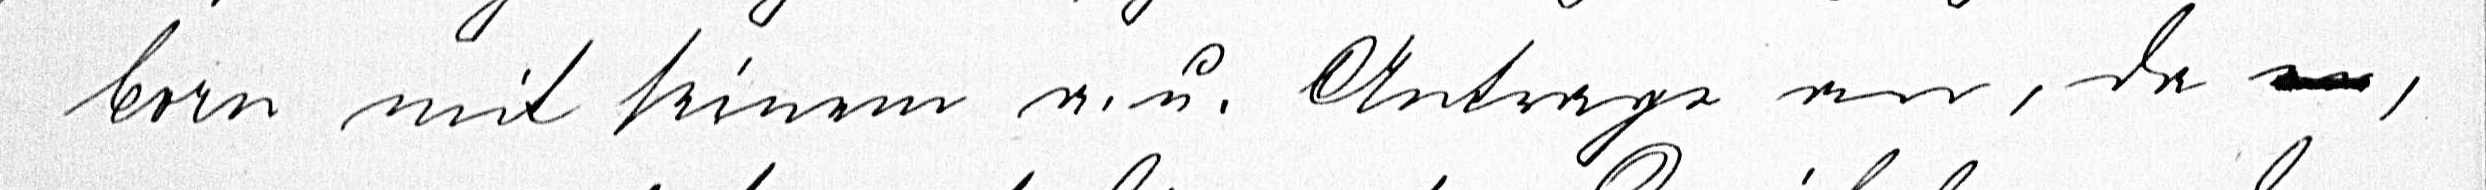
born mit seinem a. u. Antrage an, da,
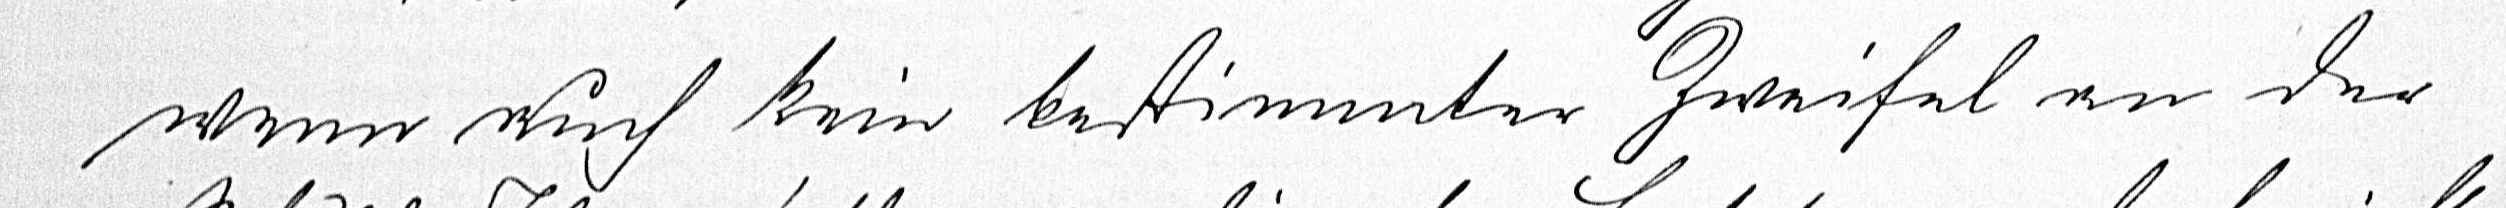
wenn auch kein bestimmter Zweifel an der
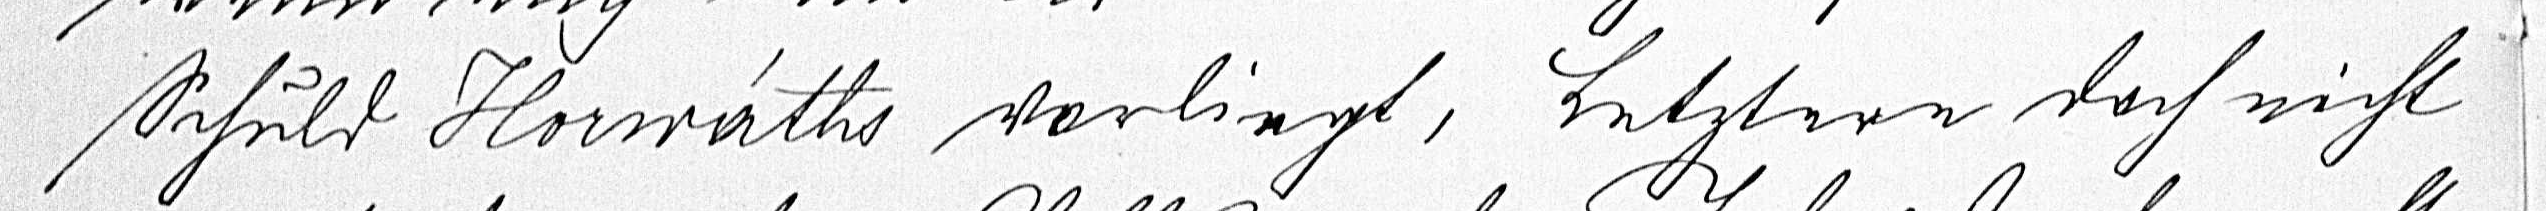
Schuld Horwáths vorliegt, Letztere doch nicht
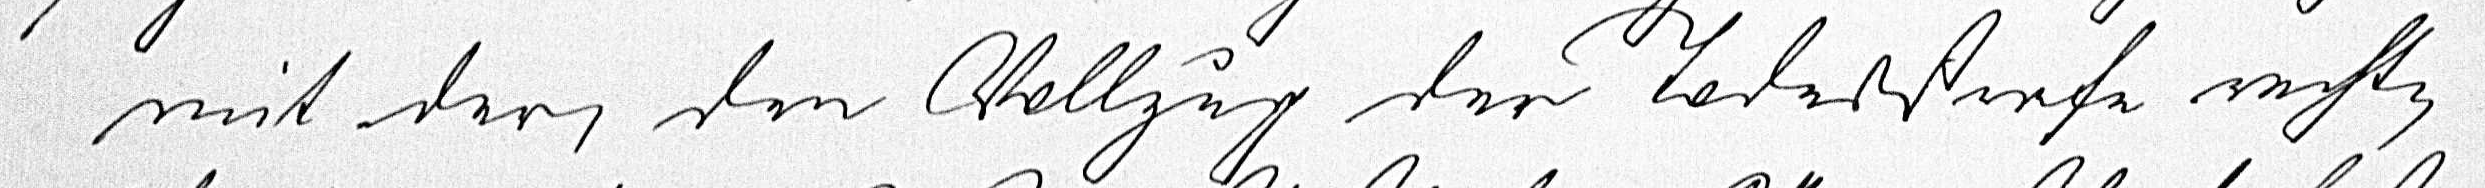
mit der den Vollzug der Todesstrafe recht¬
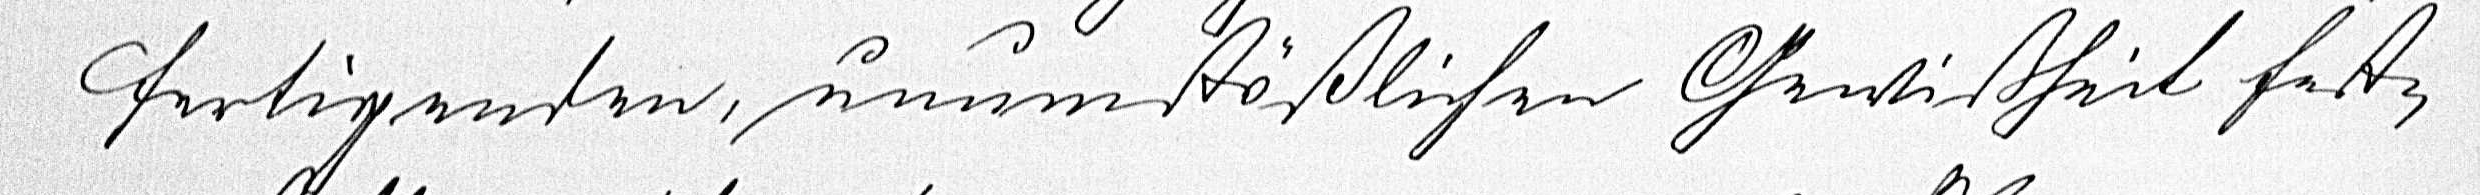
fertigenden, unumstößlichen Gewichtheit fest¬
